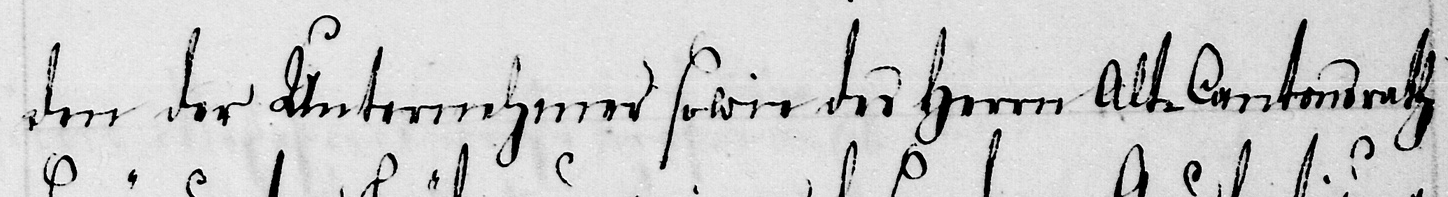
den der Unternehmer sowie des Herrn Alt-Cantonsrath
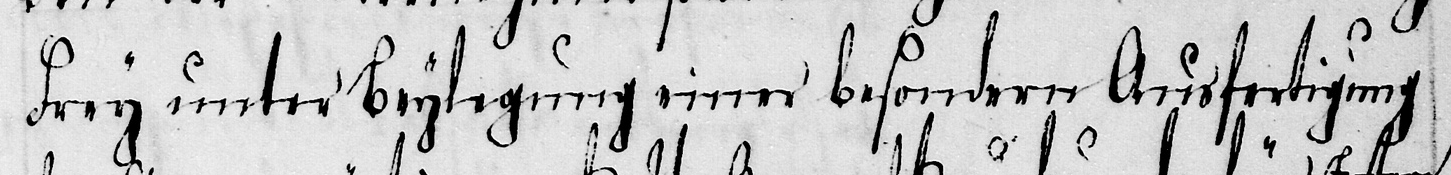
Frey unter Beylegung einer besondern Ausfertigung
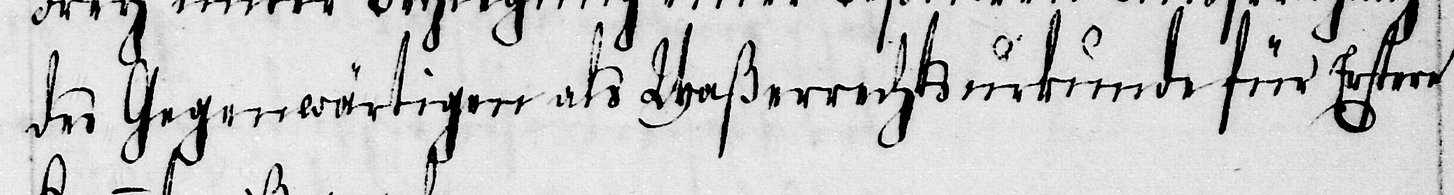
des Gegenwärtigen als Waßerrechtsurkunde für Erstere
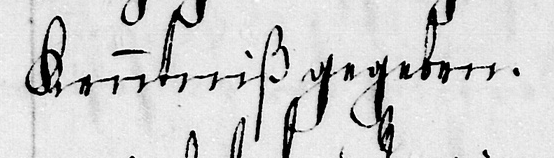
Kenntniß gegeben.
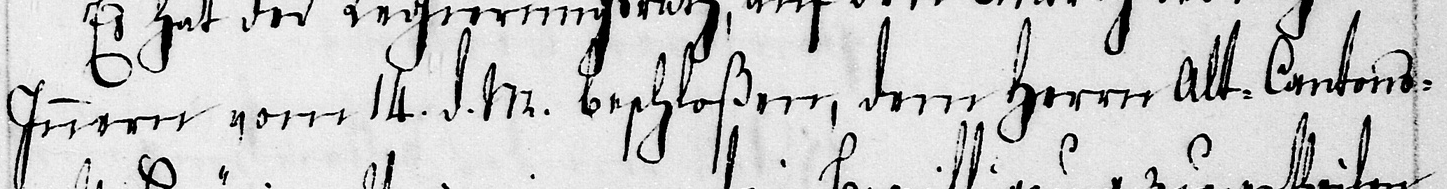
Innern vom 14. d. M. beschloßen, dem Herrn Alt-Cantons¬
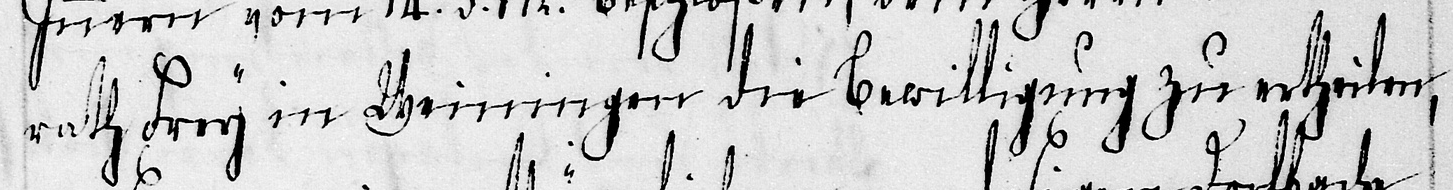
rath Frey in Weiningen die Bewilligung zu ertheilen,
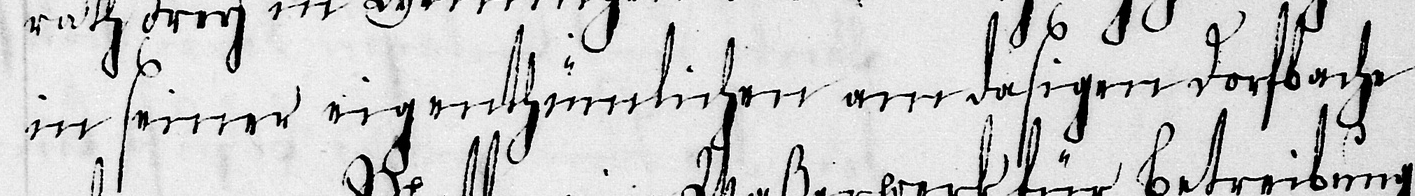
in seiner eigenthümlichen am dasigen Dorfbache
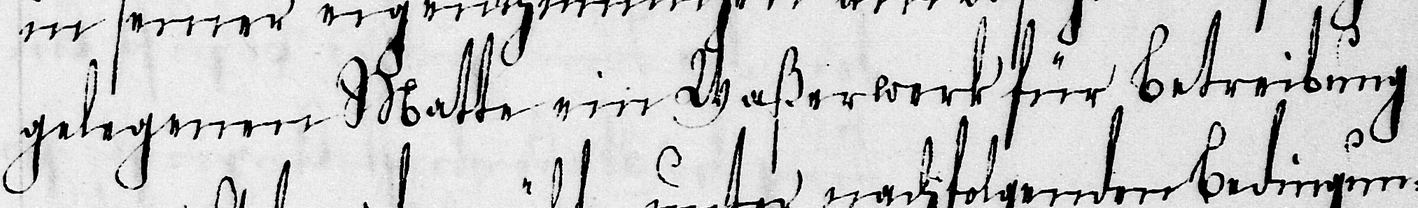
gelegenen Matte ein Waßerwerk für Betreibung
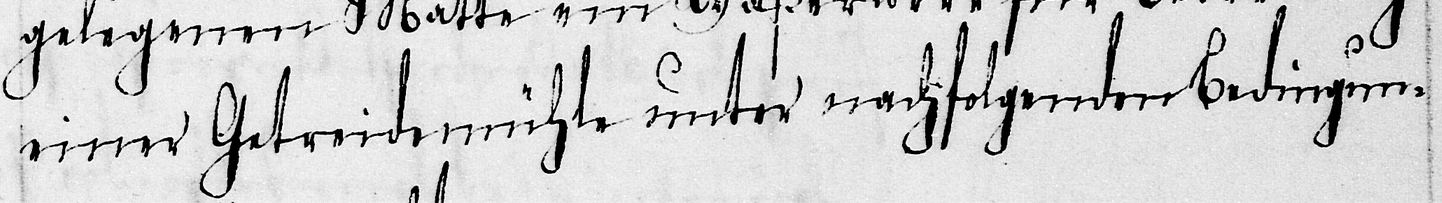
einer Getreidemühle unter nachfolgenden Bedingun¬
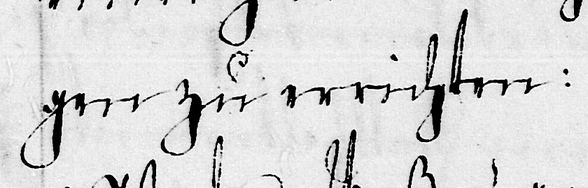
gen zu errichten:
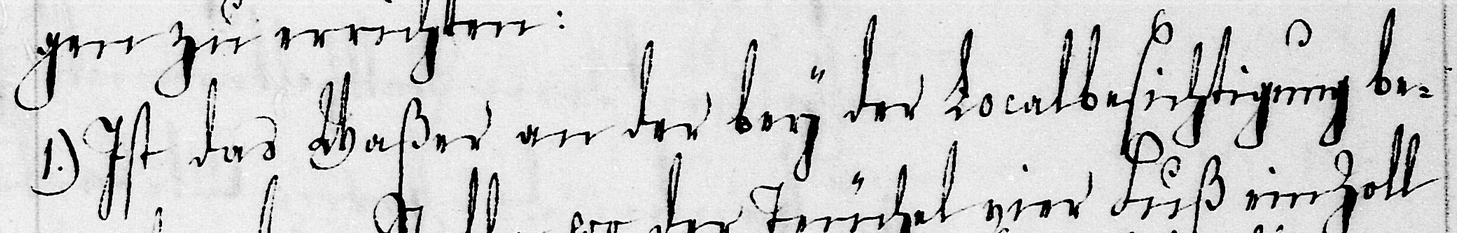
1.) Ist das Waßer an der bey der Localbesichtigung be¬
